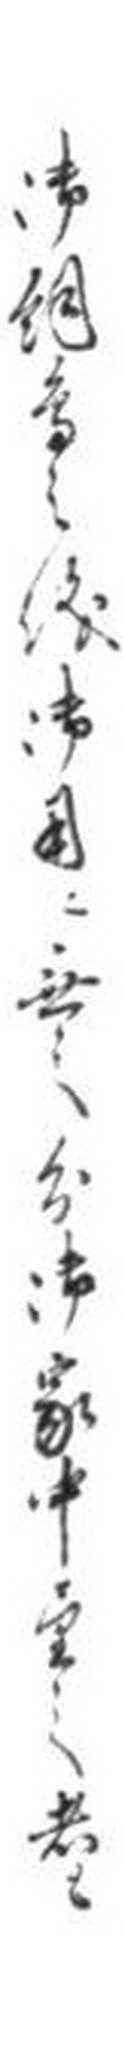御飼鳥之儀御用ニ無之分御家中望之者も
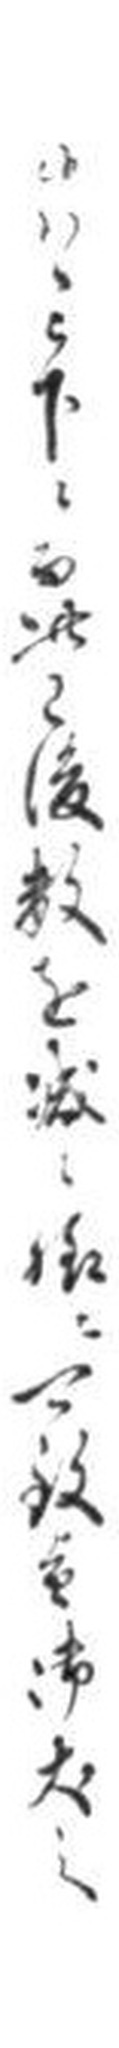候ハヽ被下ニ而此已後数を減候様ニ可致旨御犬之
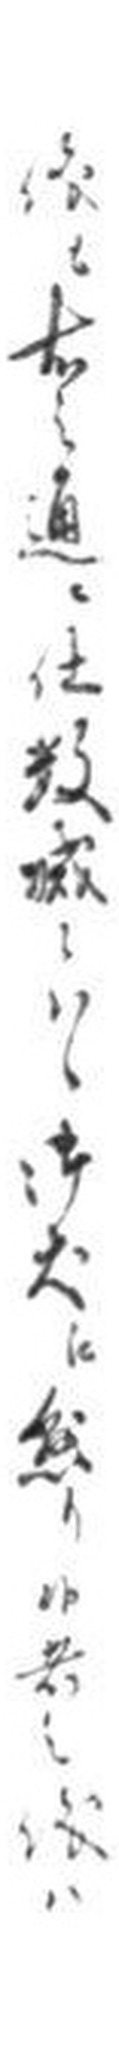儀も右之通ニ仕数減候ハヽ御犬江懸り候者之儀ハ
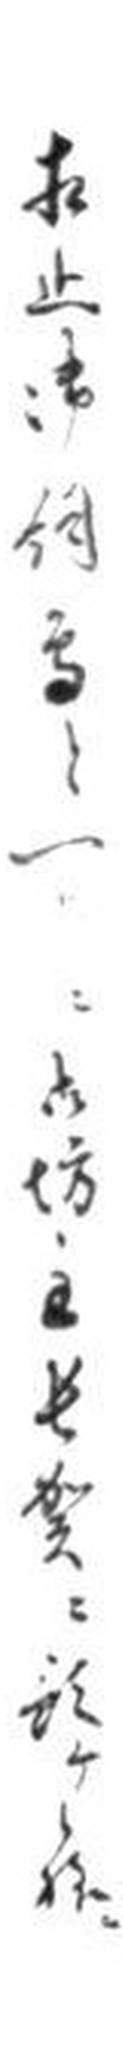相止御飼鳥と一ニ御坊主長賀ニ預ケ候様ニ
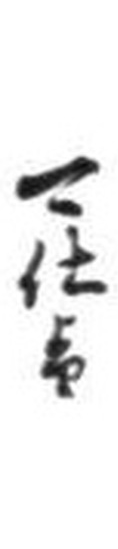可仕旨
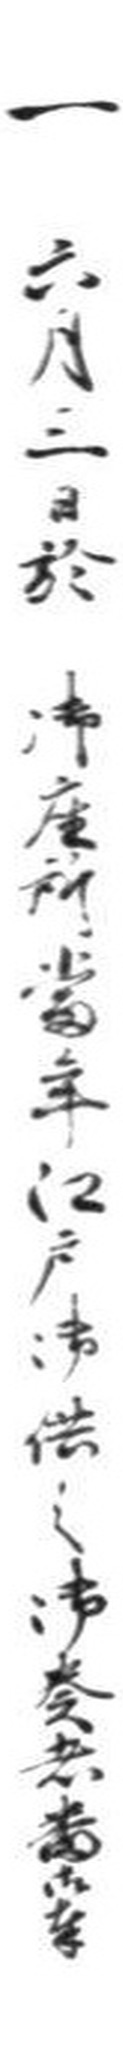一六月三日於御座所当年江戸御供之御奏者番御奉
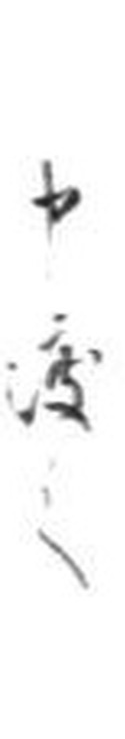申渡之
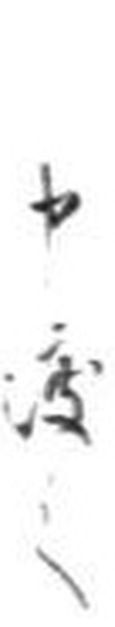申渡之
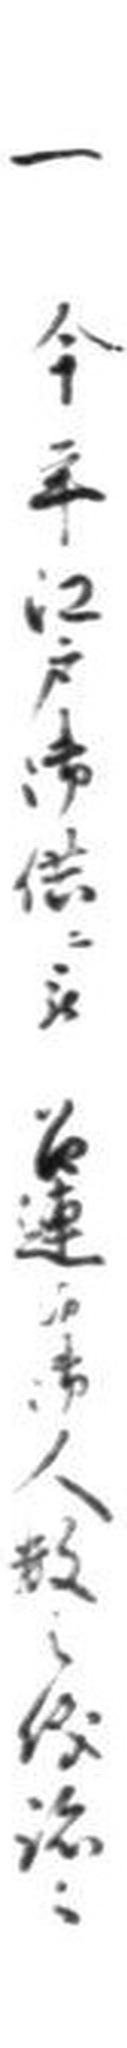一今年江戸御供ニ被召連候御人数之儀跡々
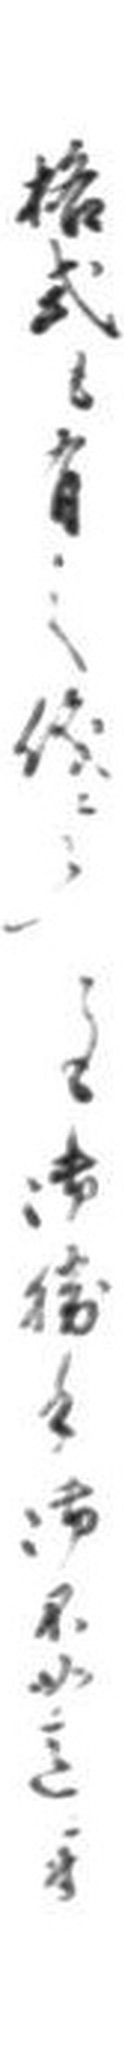格式も有之儀ニ候へとも御勝手御不如意ニ付
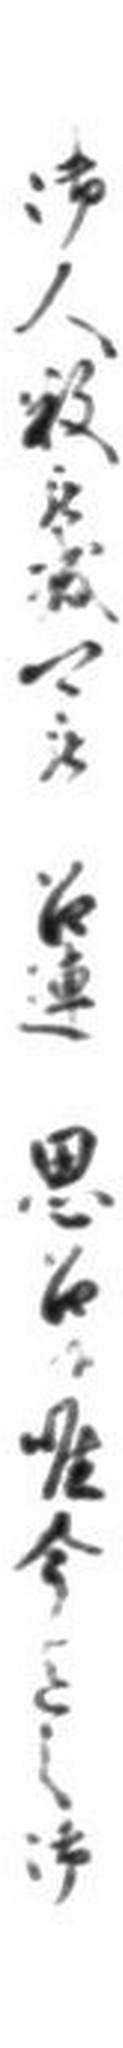御人数被減可被召連思召候唯今迄之御
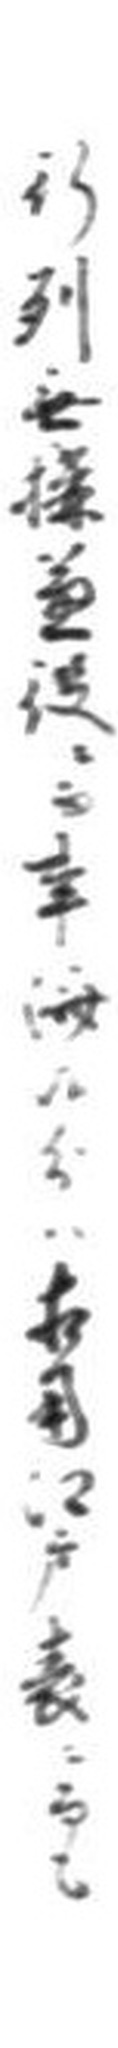行列無構兼役ニ而事済候分ハ相用江戸表ニ而も
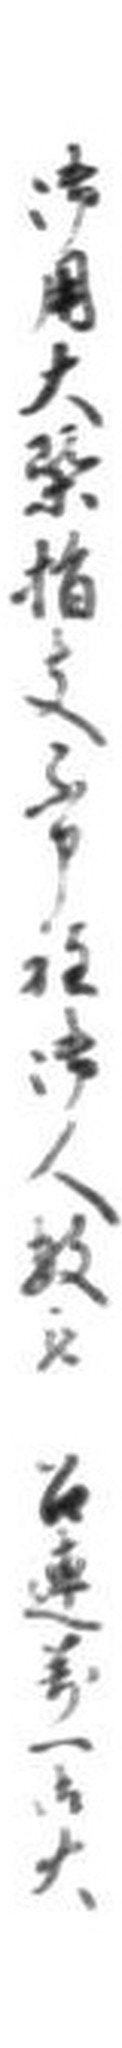御用大概指支不申程御人数被召連万一御火
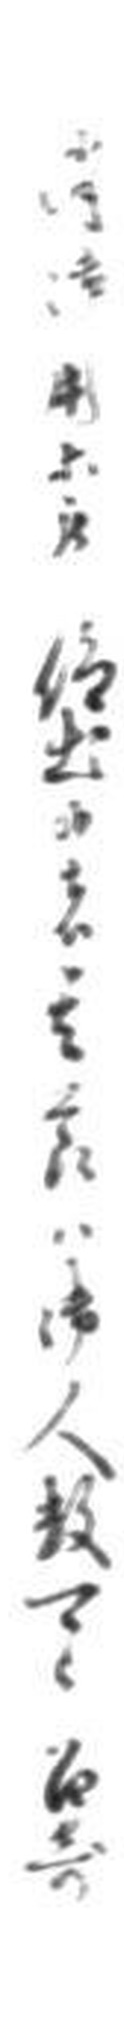消御用等被仰出候者其節ハ御人数可被召寄
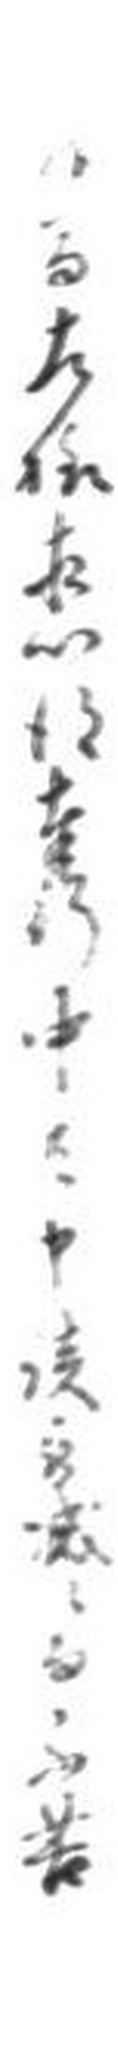候間左様相心得奉行中共申談被減候而不苦
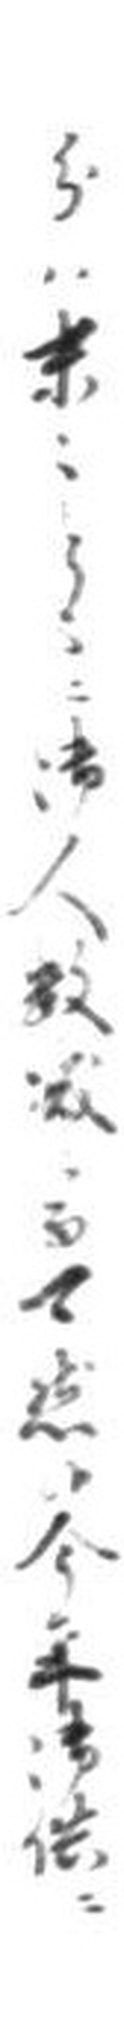分ハ末々ともニ御人数減候而可然候今年御供ニ
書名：家譜 三十六 宗昌公 従享保八年到同九年
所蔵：福井県文書館 Fukui Prefectural Archives
